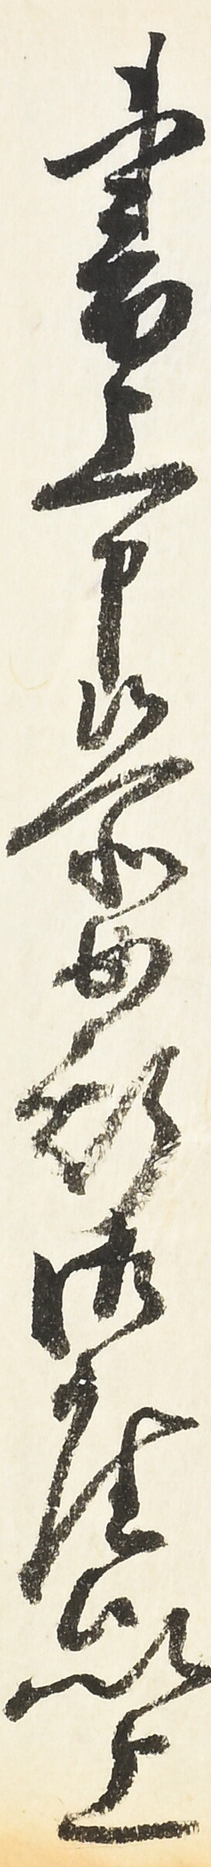書上申候所如斯御座候以上
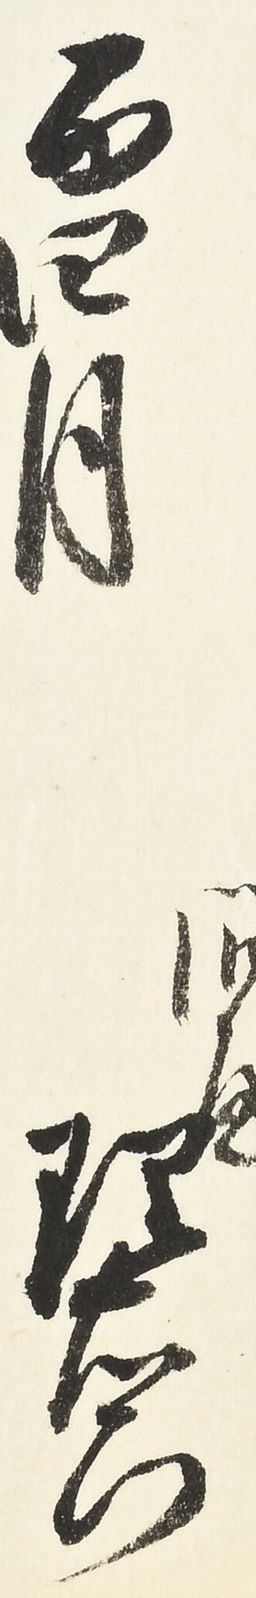酉四月理右衛門
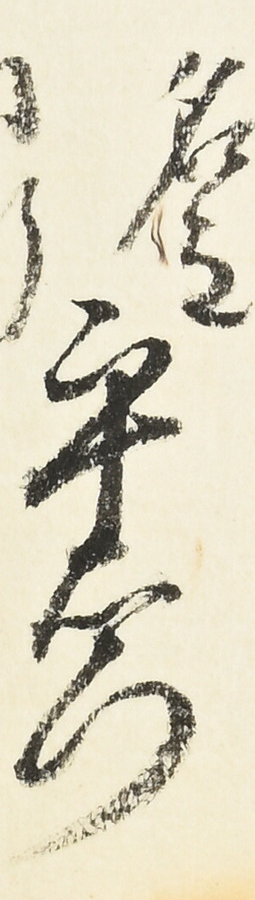平右衛門
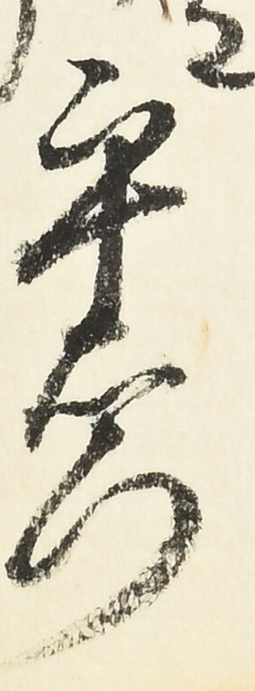平右衛門
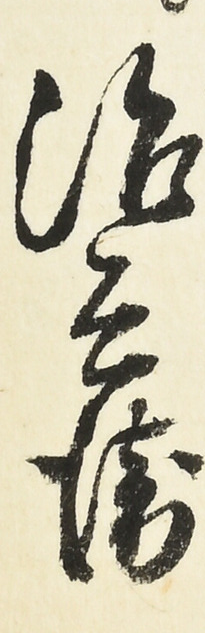治兵衛
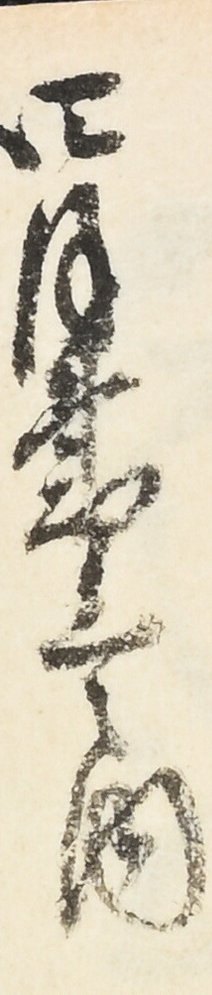四月廿七日着

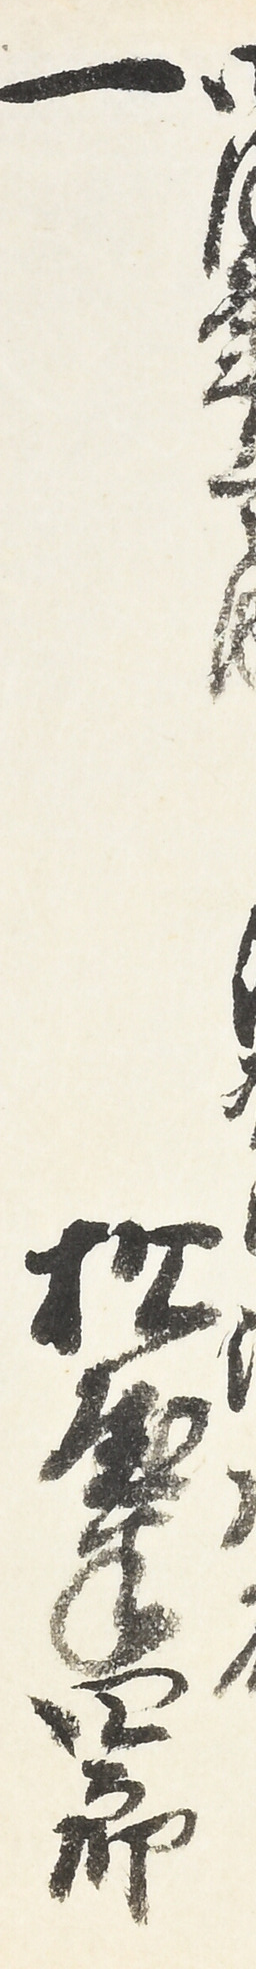一松屋半四郎
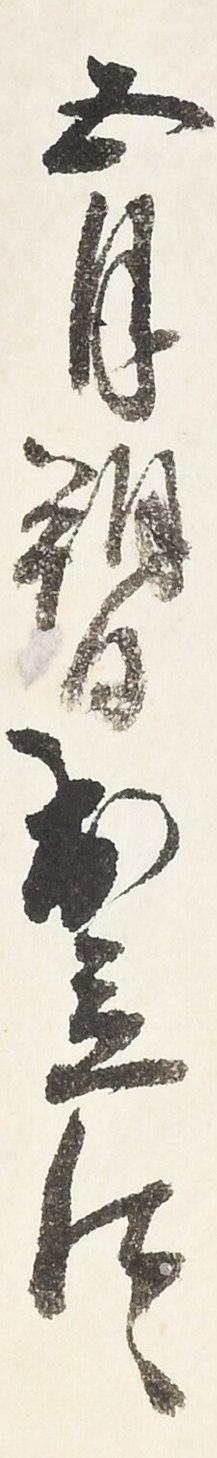五月朔日出立仕候
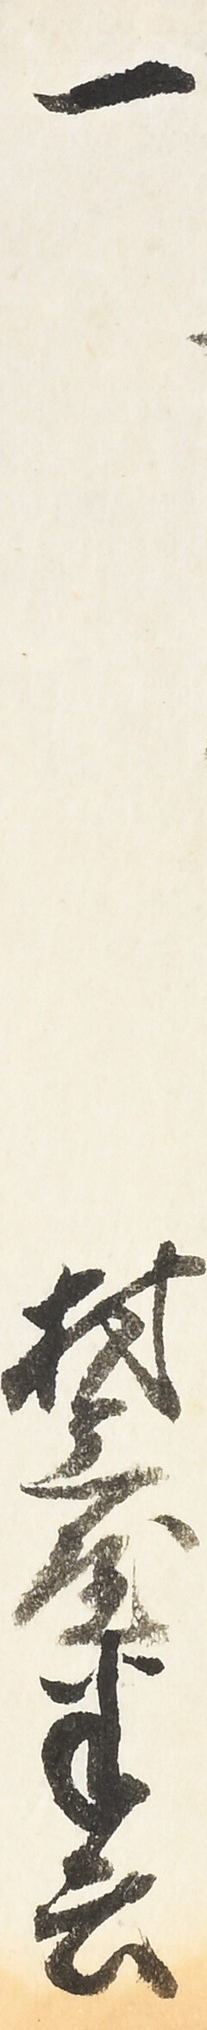一村上屋半六
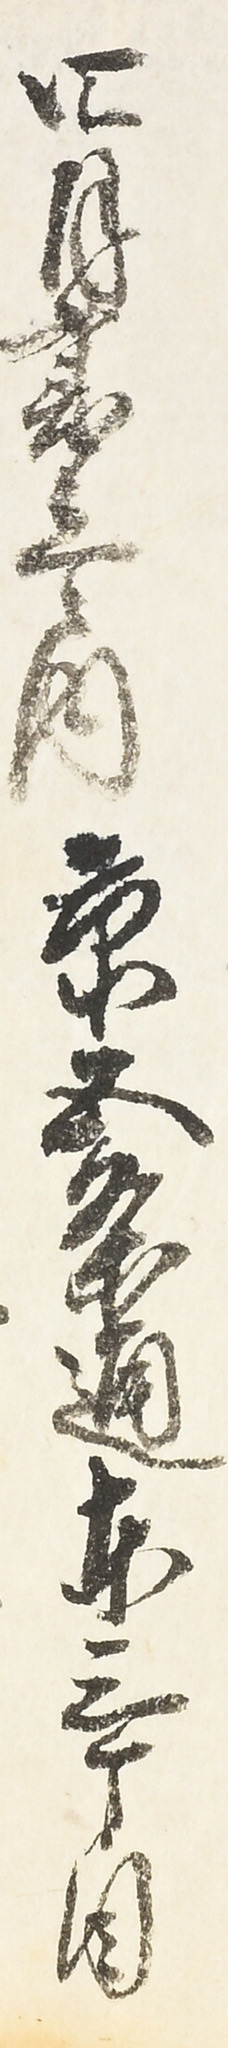四月書上之内京五条通東三丁目
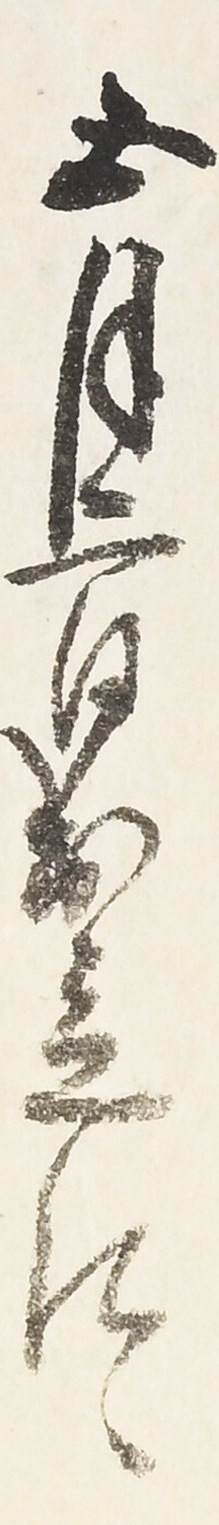五月二日出立仕候
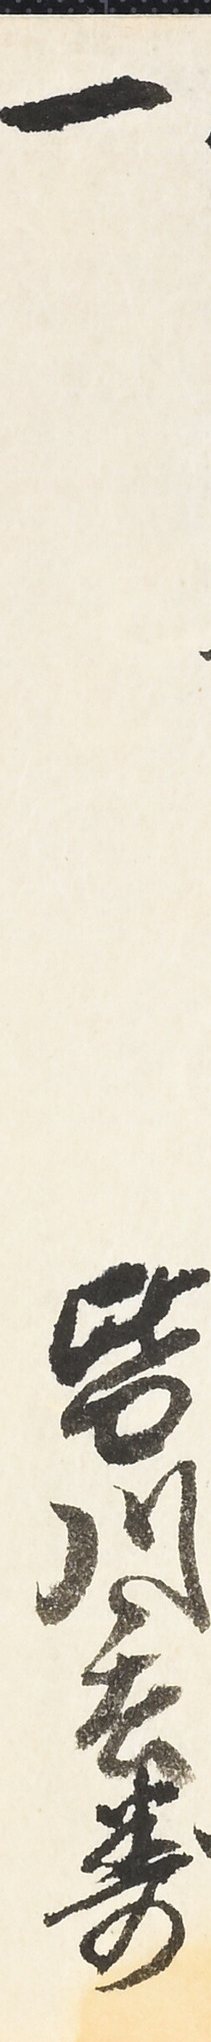一皆川春寿
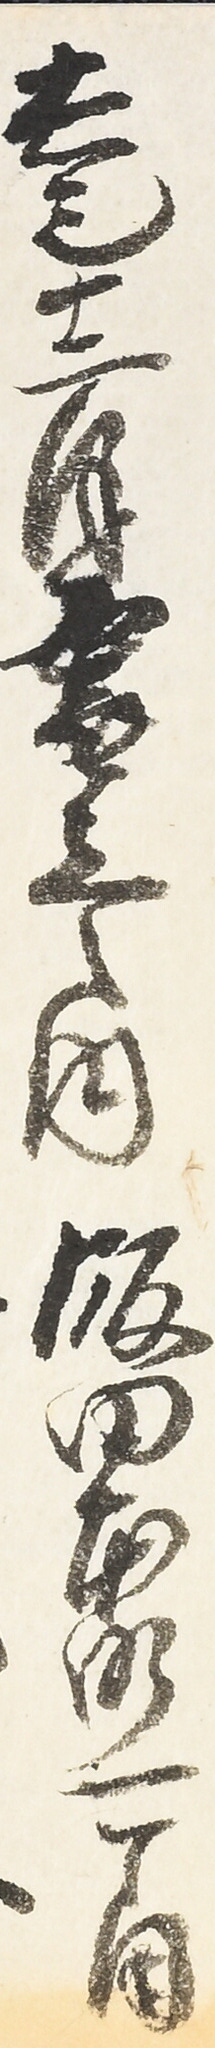去年十二月書上之内飯田本町一丁目
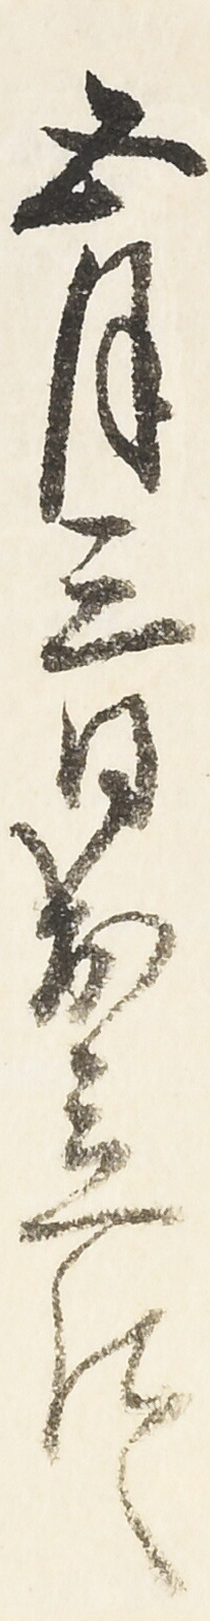五月三日出立仕候
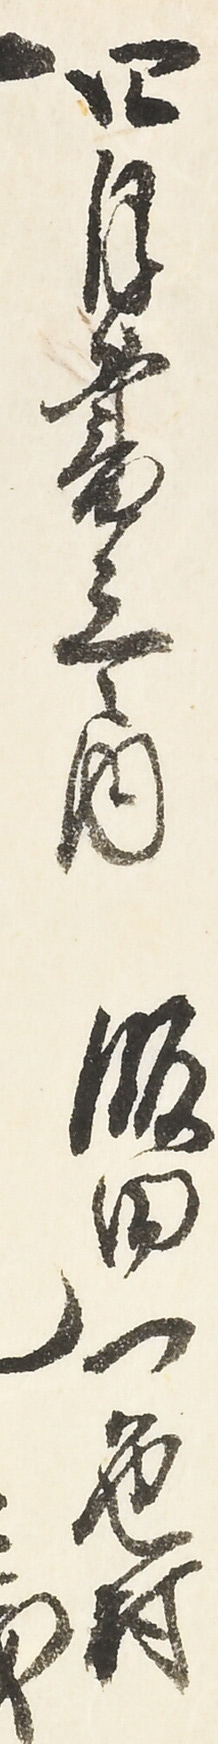四月書上之内飯田一色村
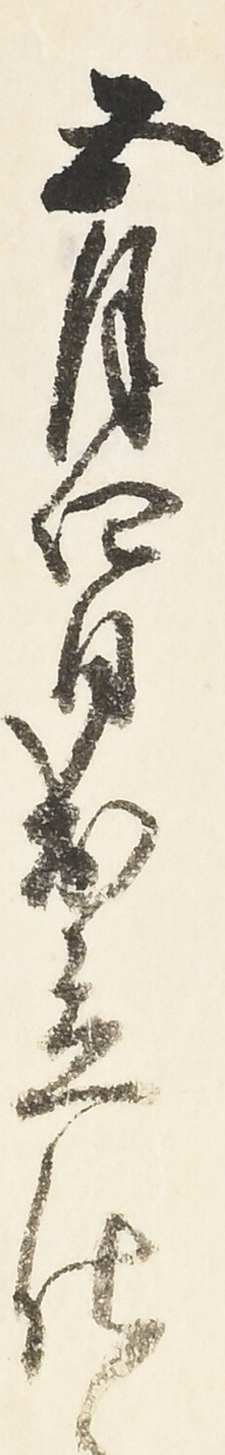五月四日出立仕候
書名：町中旅人泊控帳
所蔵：伊那市立高遠町図書館・合同会社AMANE
